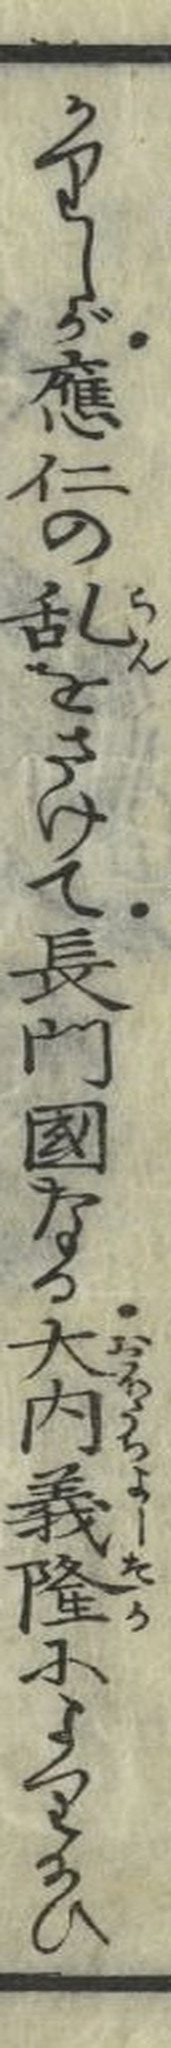かりしが・應仁の乱をさけて・長門國なる・大内義隆により給ひ
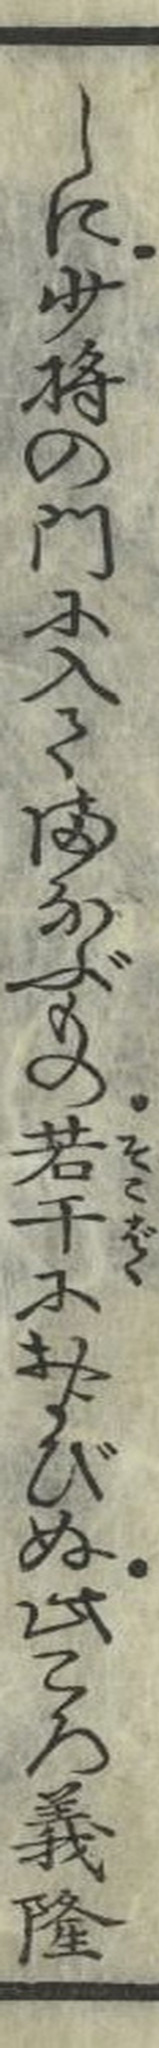しに・少將の門に入てまなぶもの・若干におよびぬ・此ころ義隆
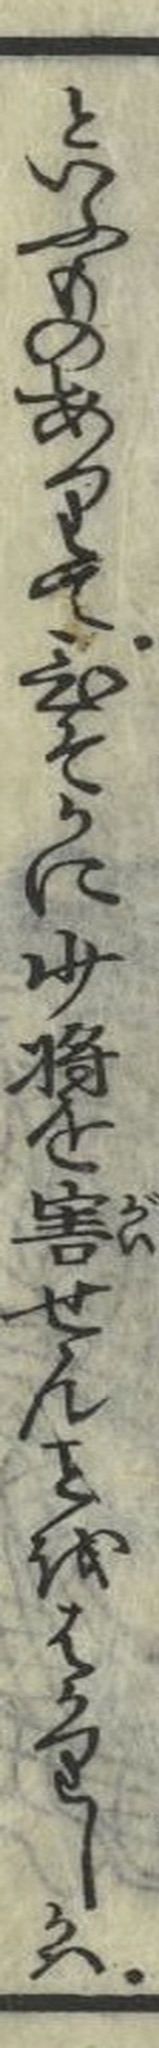といふものありて・ひそかに少將を害せんことをはかりしかは・
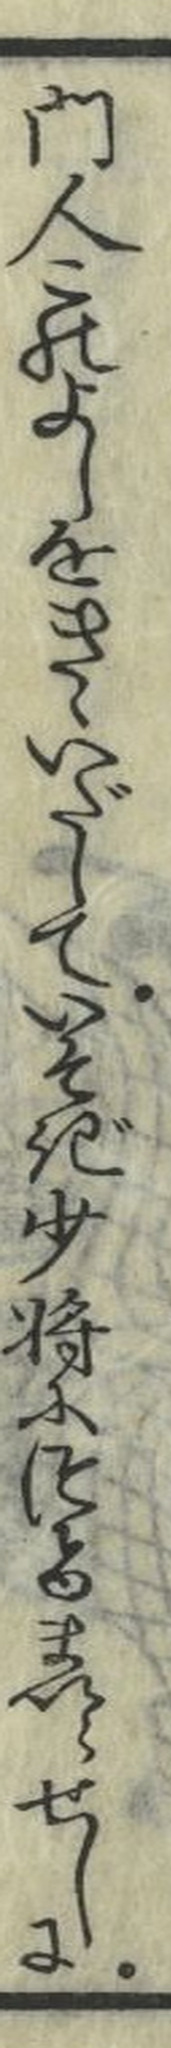門人このよしをきゝいだして・いそぎ少將につけまいらせしに・
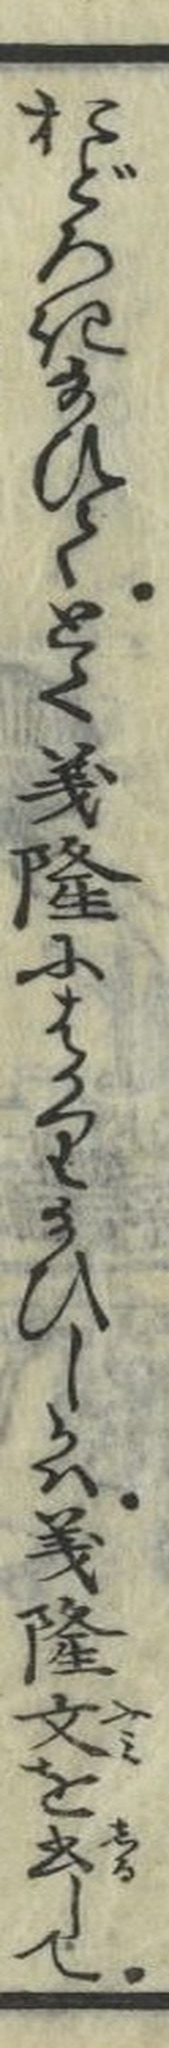おどろき給ひて・とく義隆にはかり給ひしかは・義隆文を書して・
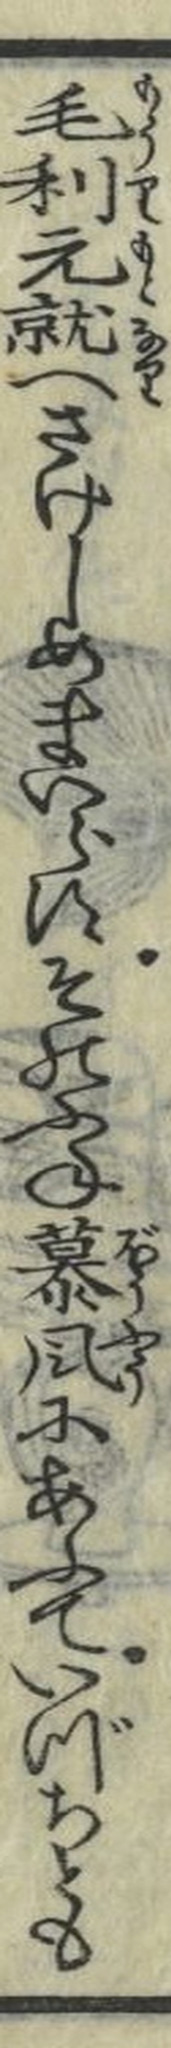毛利元就へさけしめまいらす・そのふね暴風にあふて・いづちとも
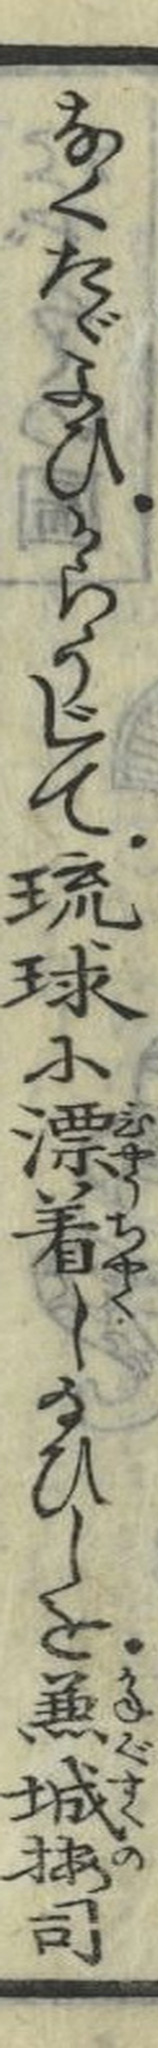なくたゞよひ・からうじて・琉球に漂着し給ひしを・兼城按司
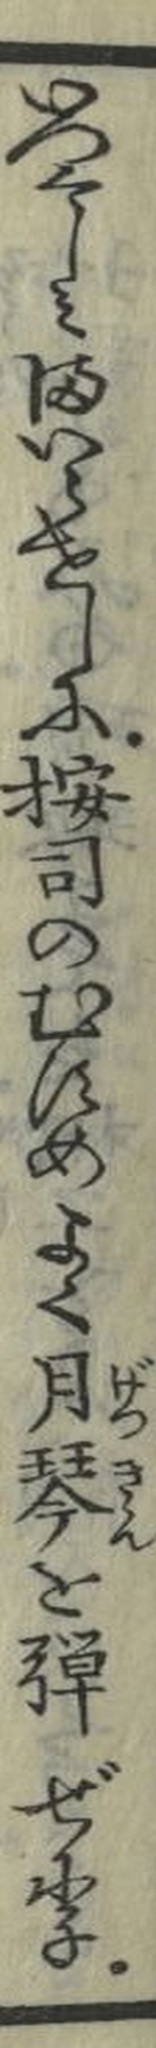いつくしみまいらせしに・按司のむすめよく月琴を弾ぜり・
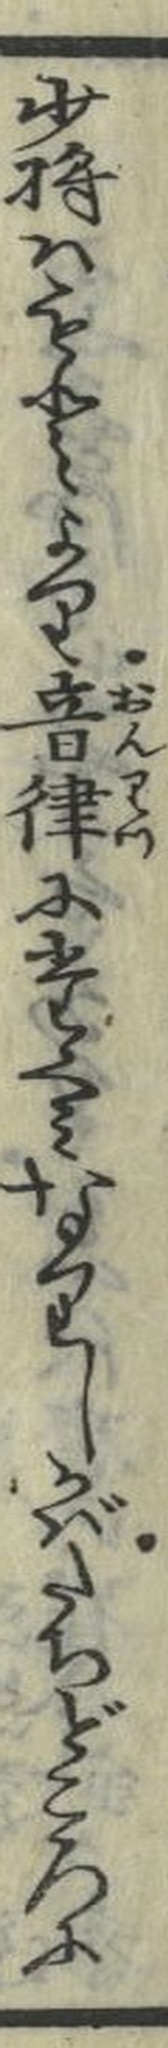少將はもとより・音律にたくみなりしかば・たちどころに
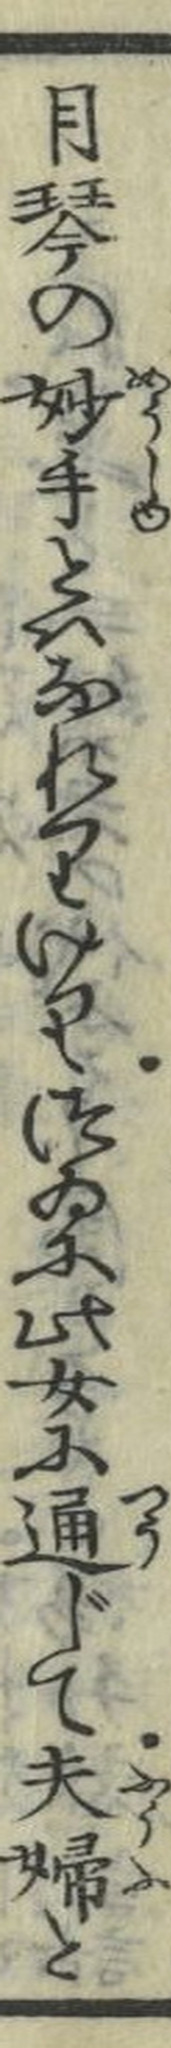目琴の妙手とはなれりけり・つゐに此女に通じて・夫婦と
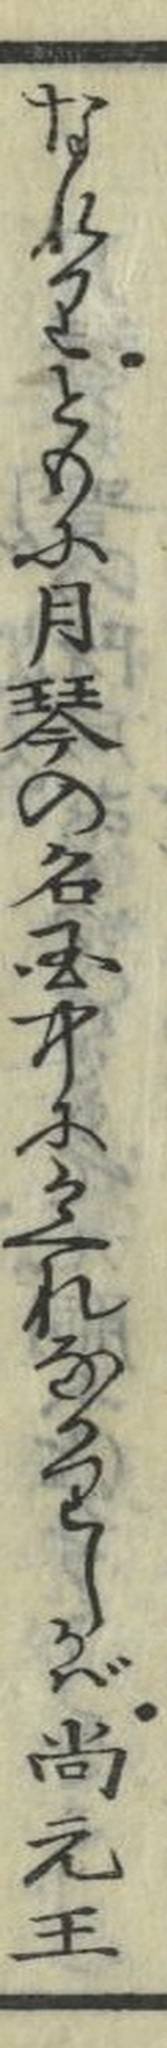なれり・ともに月琴の名国中にかくれなかりしかば・尚元王
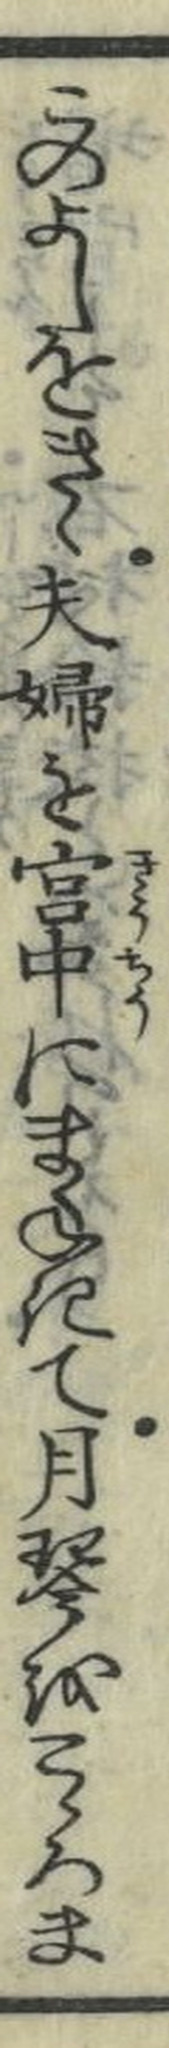このよしをきく。夫婦を宮中にまねきて・月琴をこゝろま
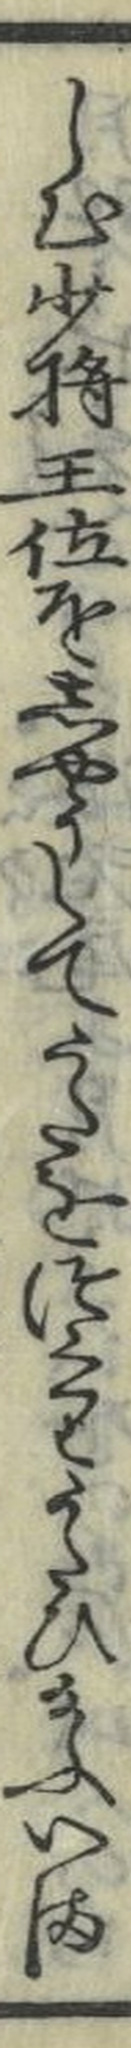しむ・少將王位をしやうして・うたをつくりうたひ給ふ・いま
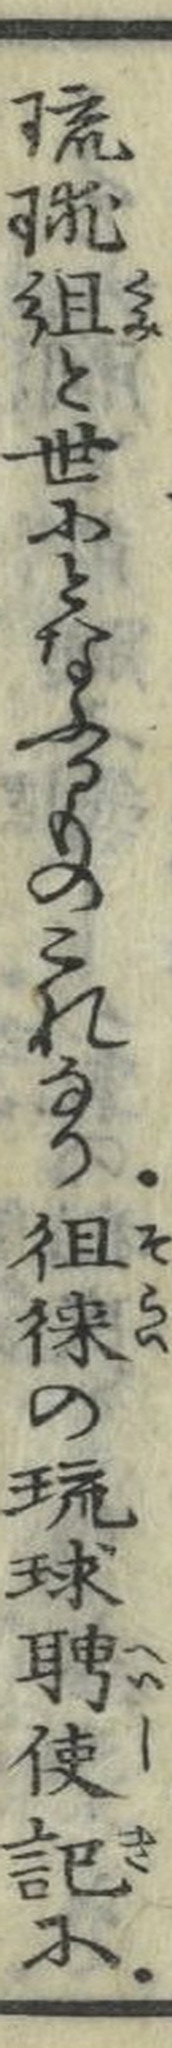琉球組とよにとなふるものこれなり・徂徠の琉球聘使記に・
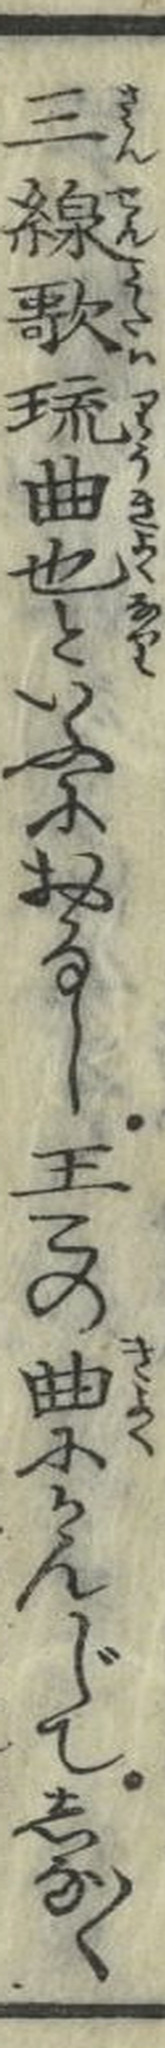三線歌琉曲也といふにおなし・王この曲にかんじて・しな〳〵
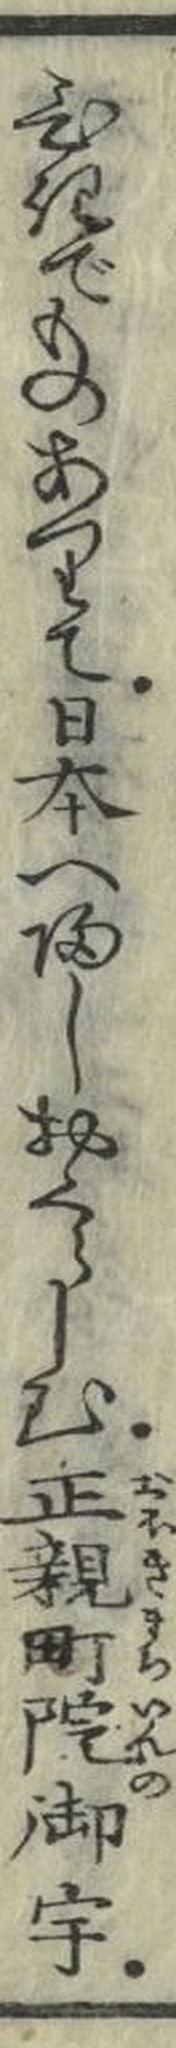ひきでものありて・日本へ歸しおくらしむ・正親町院御宇・
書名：琉球秊代記 附雑話 全
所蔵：University of the Ryukyus Library
